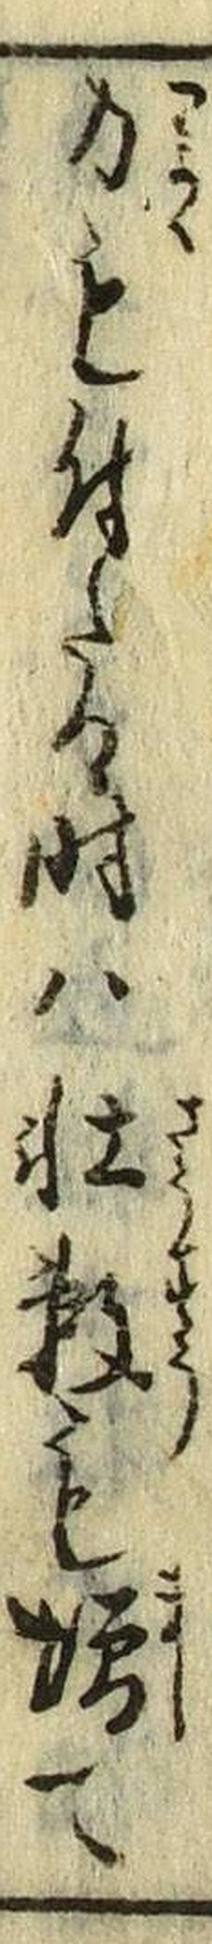力も付たる時は壮数も増て
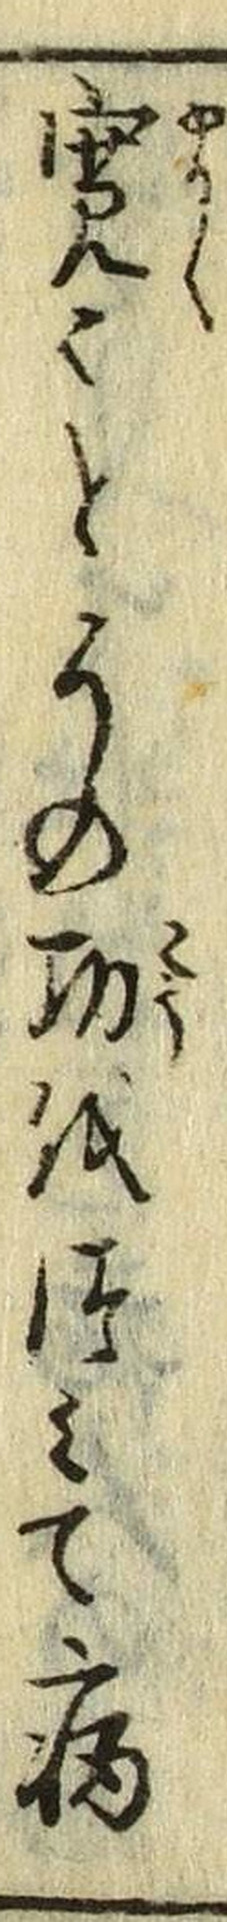寛々とその功をつみて病
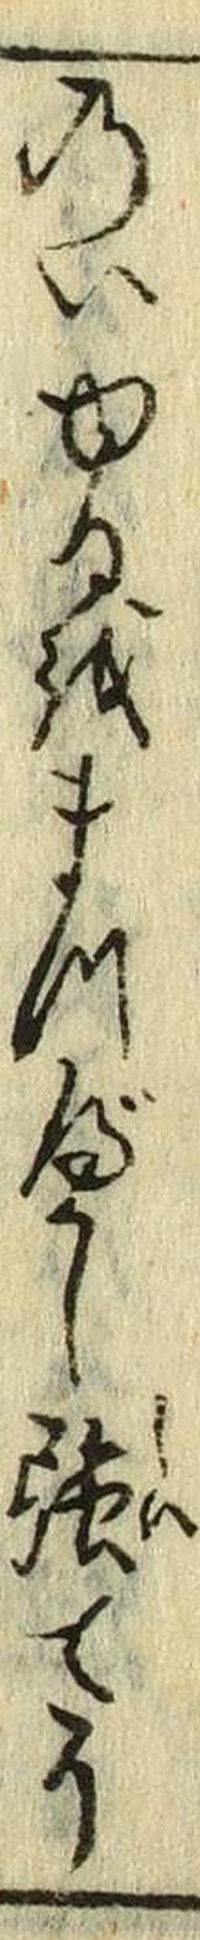のいゆるをまつべし強てそ
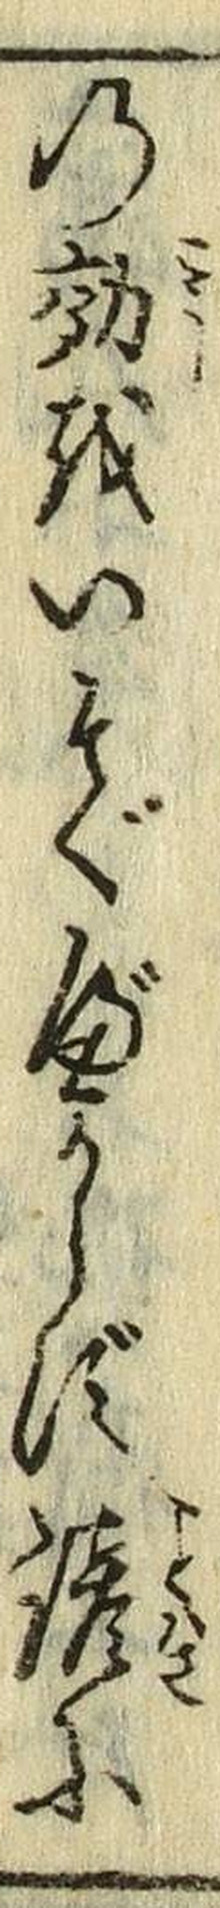の効をいそぐべからず諺に
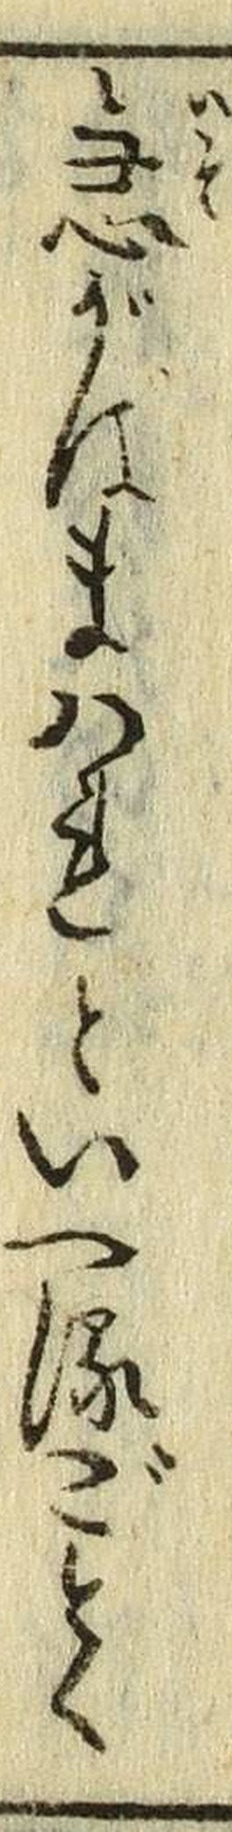急がばまはれといへるごとく
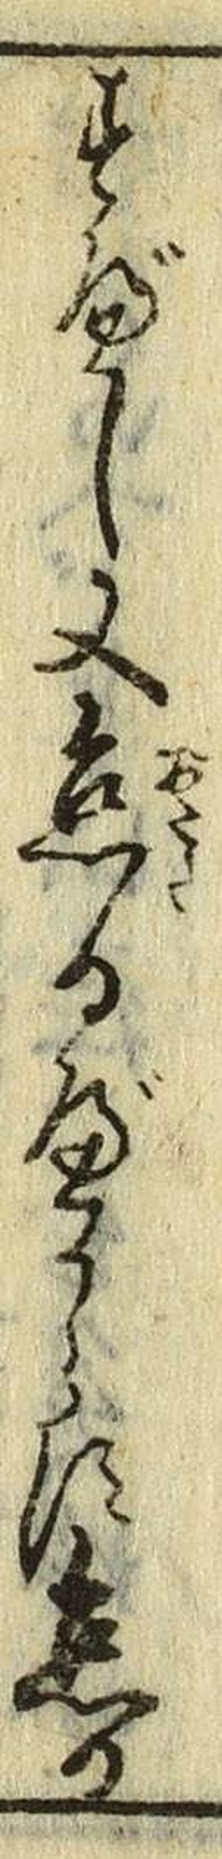すべし又怠るべからす怠り
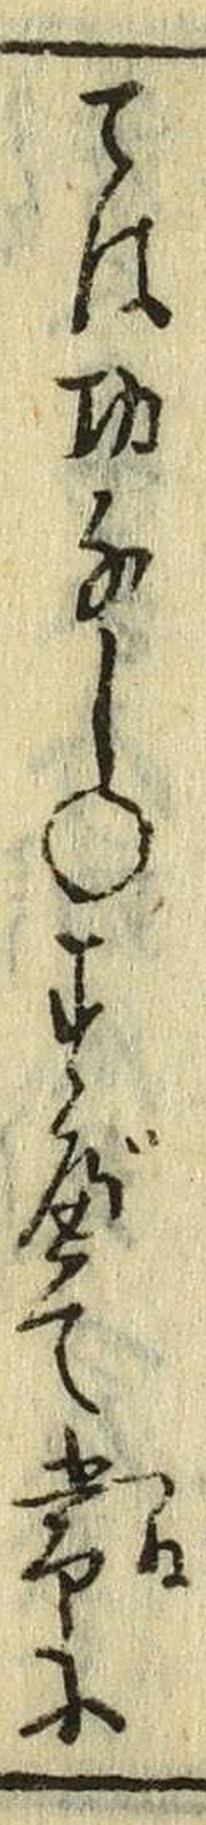ては功なし○すべて常に
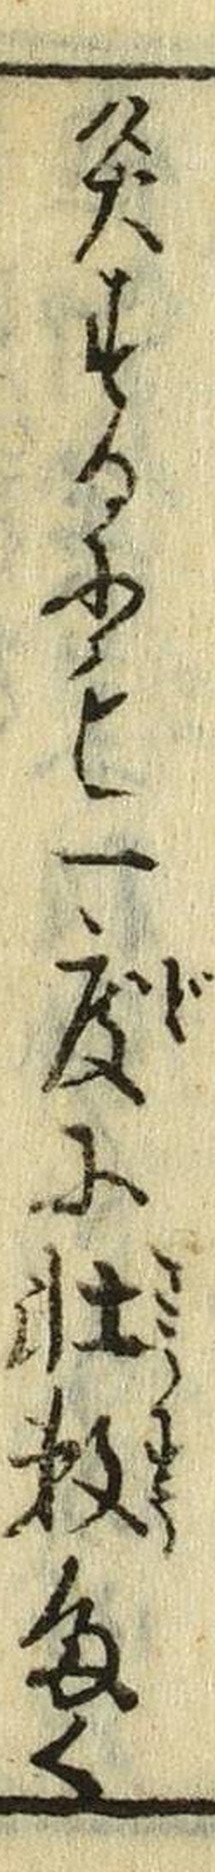灸するにも一度に壮数多く
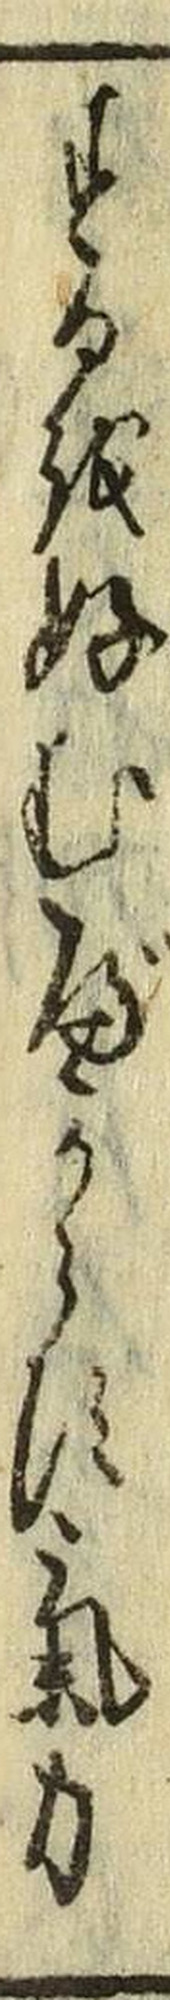するを好むべからす気力
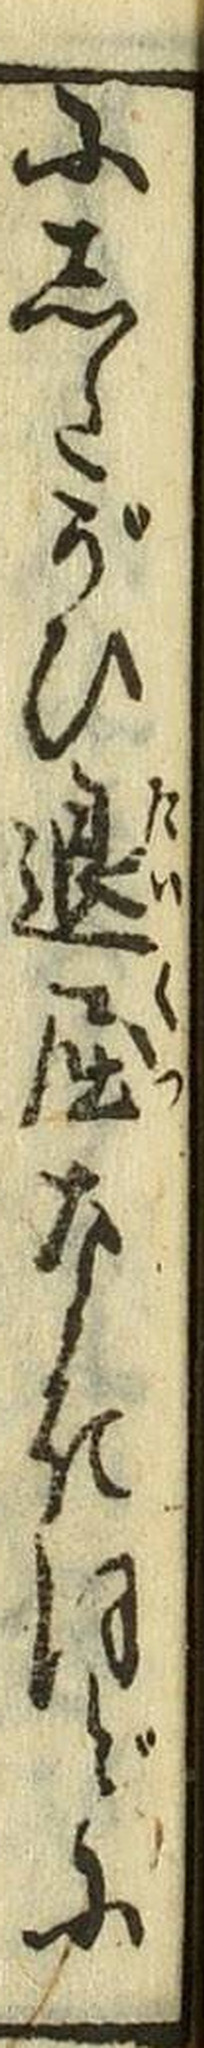にしたがひ退屈なきほどに
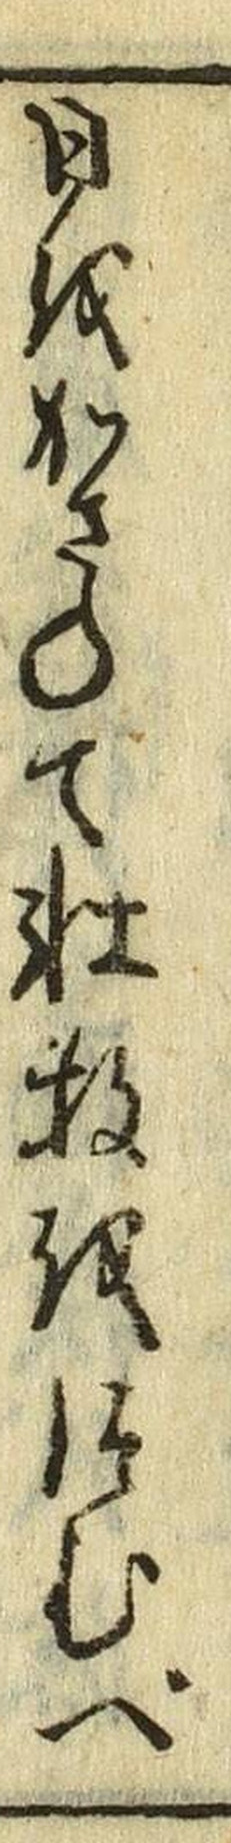日をかさねて壮数をつむべ
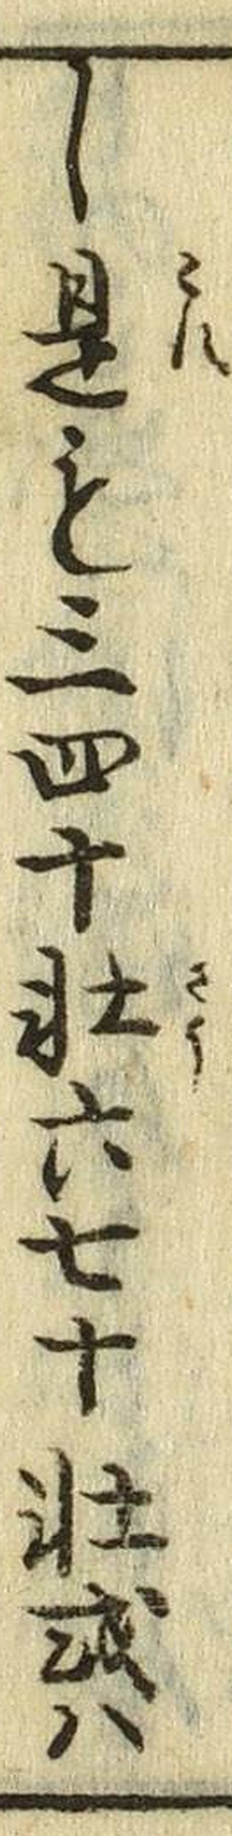し是も三四十壮六七十壮或は
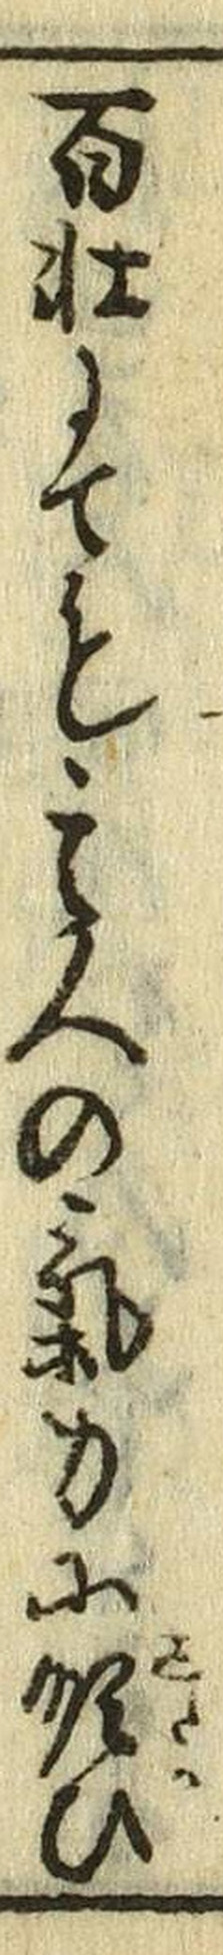百壮にても其人の気力に順ひ
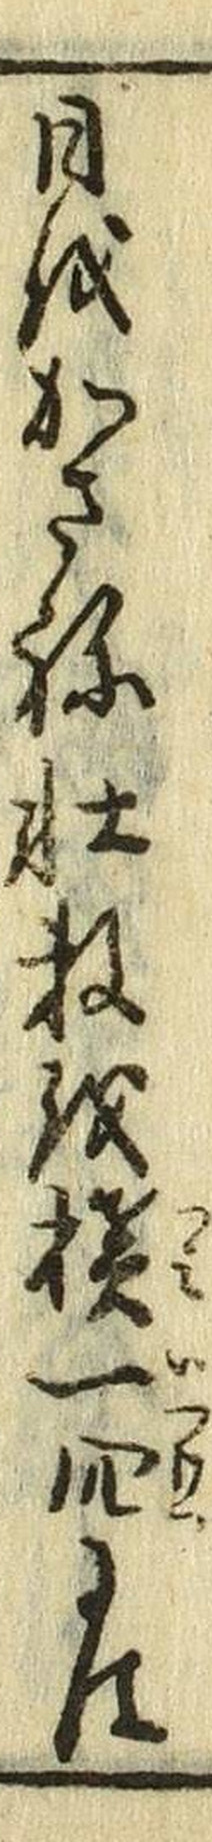日をかさね壮数を積一穴には
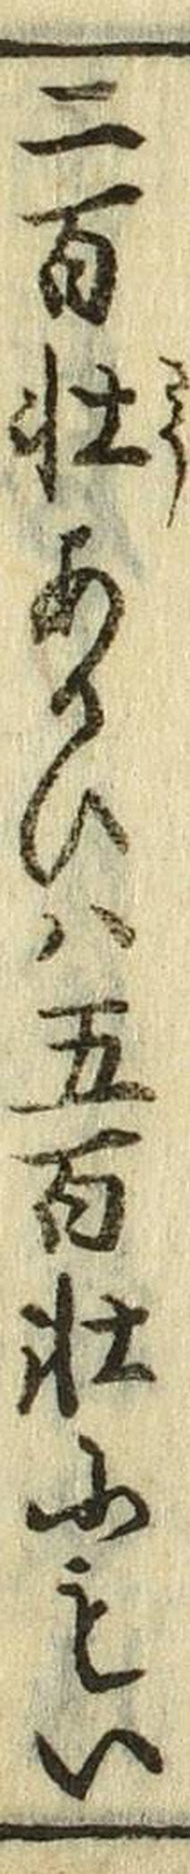二百壮あるひは五百壮にもい
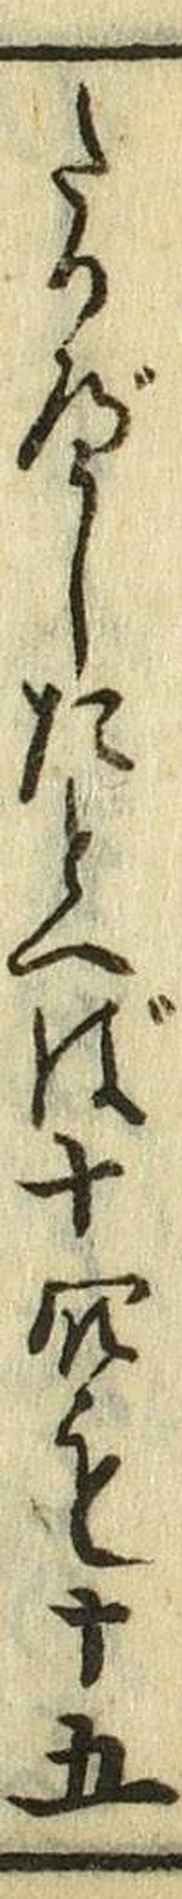たるべしたとへば十穴も十五
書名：居家養生記
